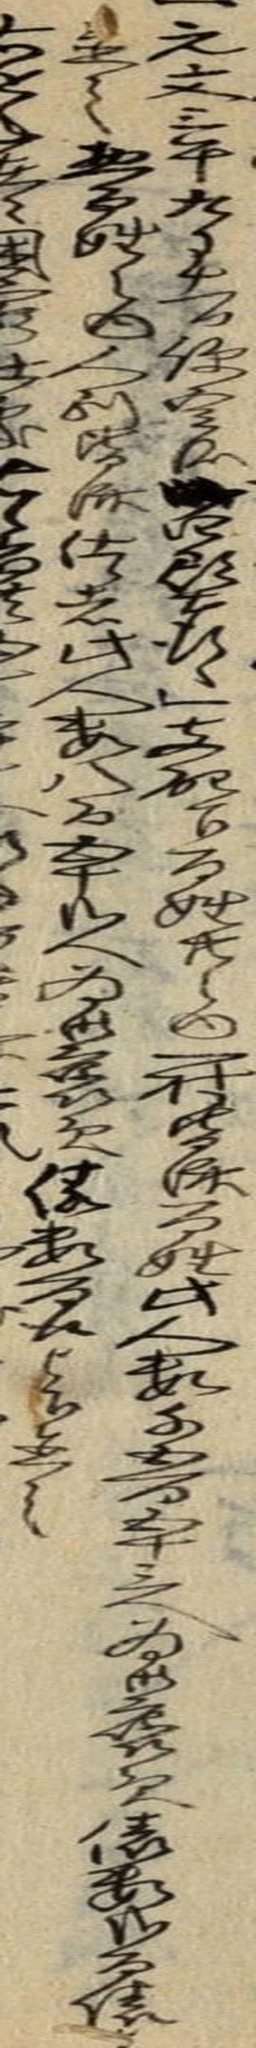置之惣百姓之内人別皆済仕候者此人数八百五十弐人為御褒美俵数百俵被下置之
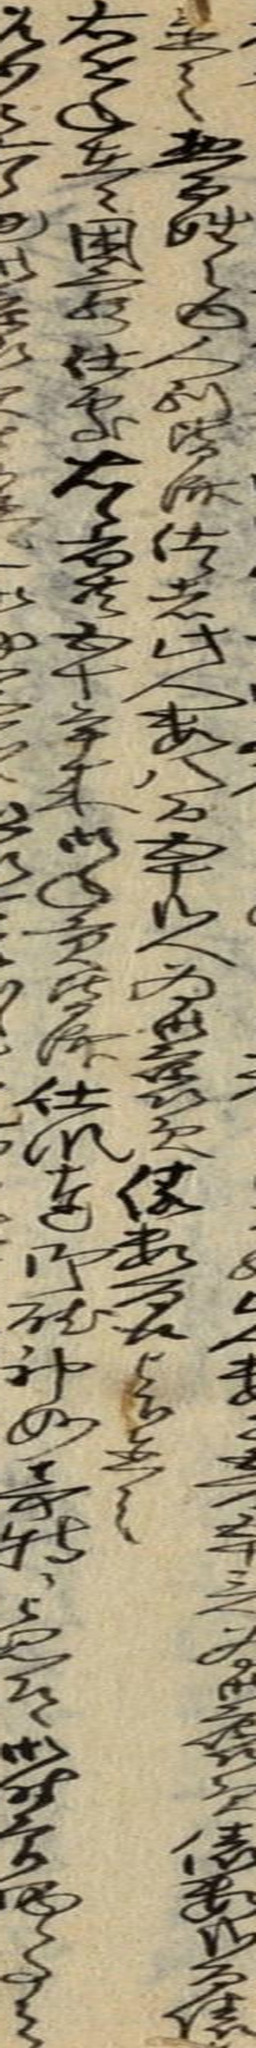右近年在々困窮仕候処右之者共五十年来御年貢皆済仕段達御聴神妙奇特に被思召候御時節柄候之事に候故
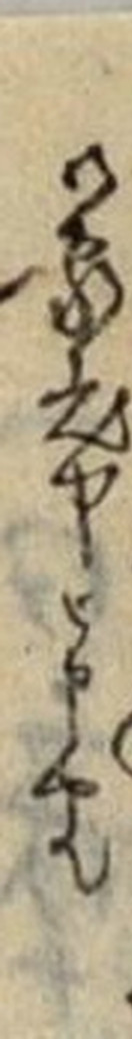御家老中被申聞候
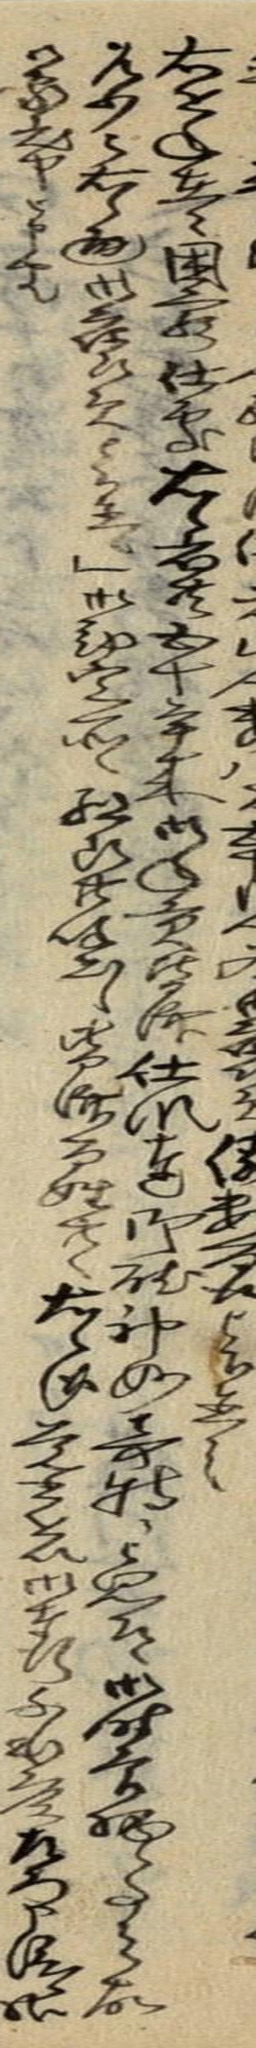乍少々右之通御褒美被下置候」御勘定所へ組頭共呼出し皆済百姓共へ右之趣覚書を以御奉行千本藤左衛門申渡候様
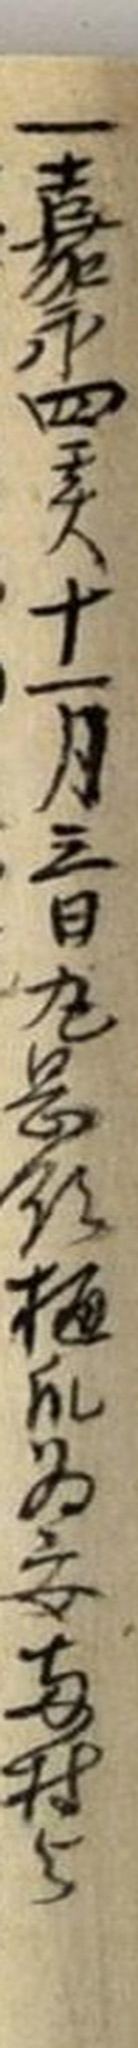一嘉永四亥十一月三日丸岡領樋爪為安両村と
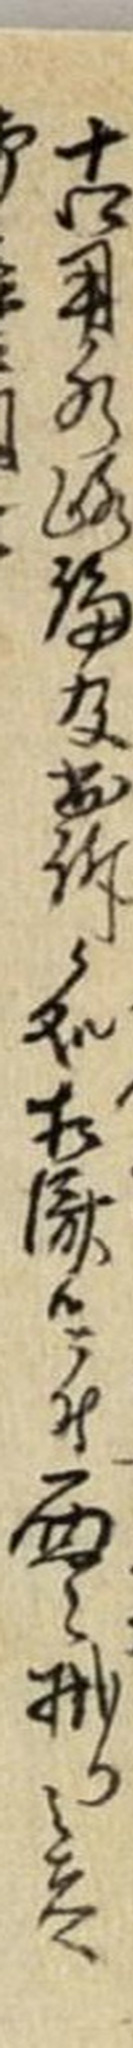十郷用水路論及出訴候処相済候に付面々掛り之者へ
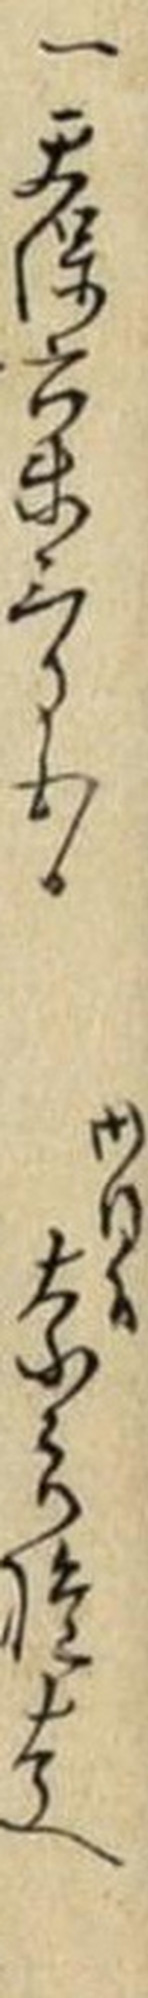一天保六未三月五日御目付奈良権太夫
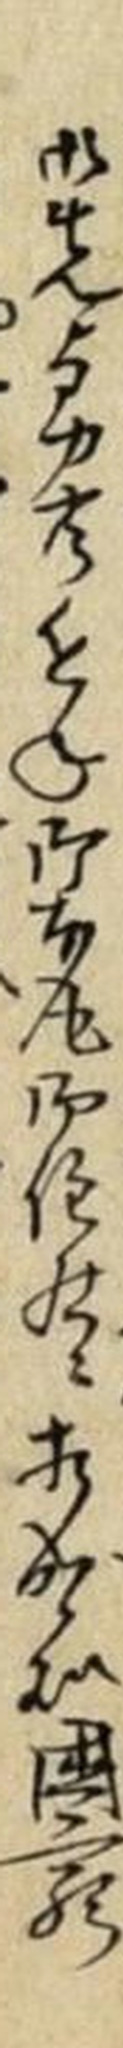御先与力共近年御本丸御住居に相成候処困窮
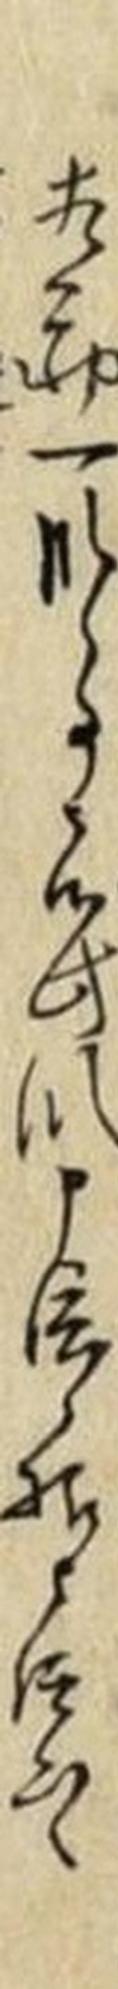相勤一段之事に候此段申渡候様被仰出候
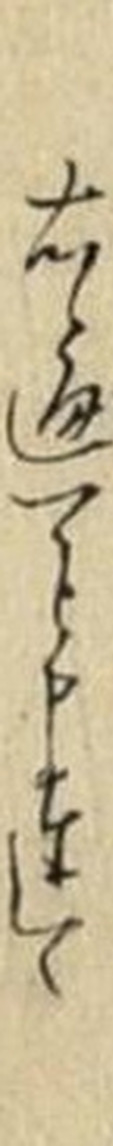右之通可被申達候

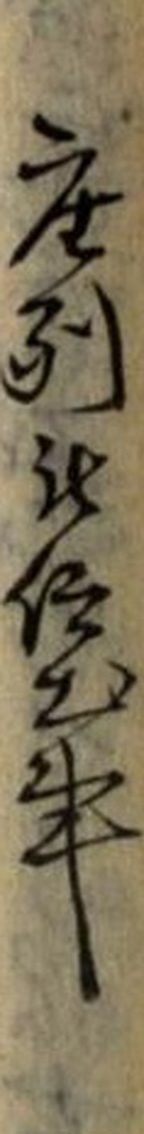座列被仰出事
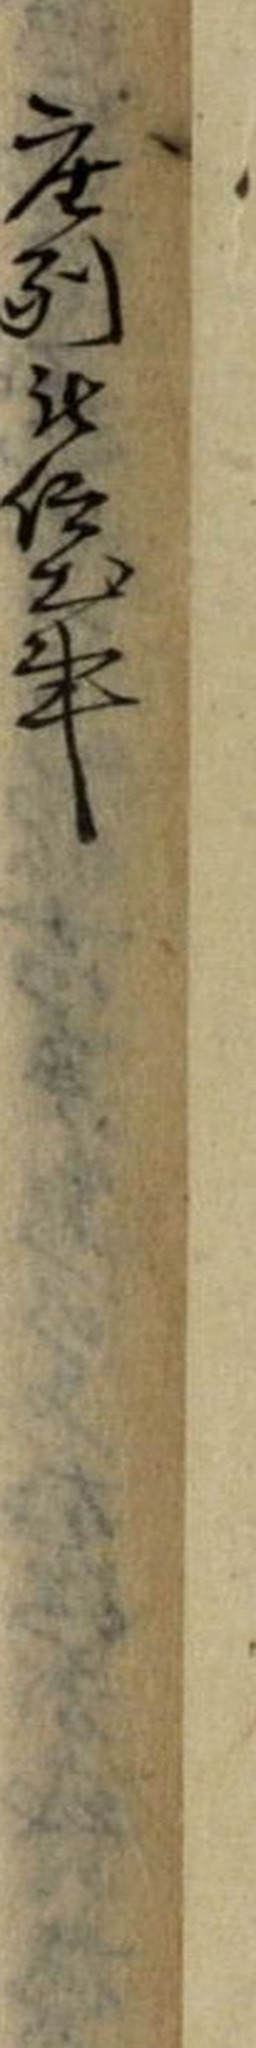座列被仰出事
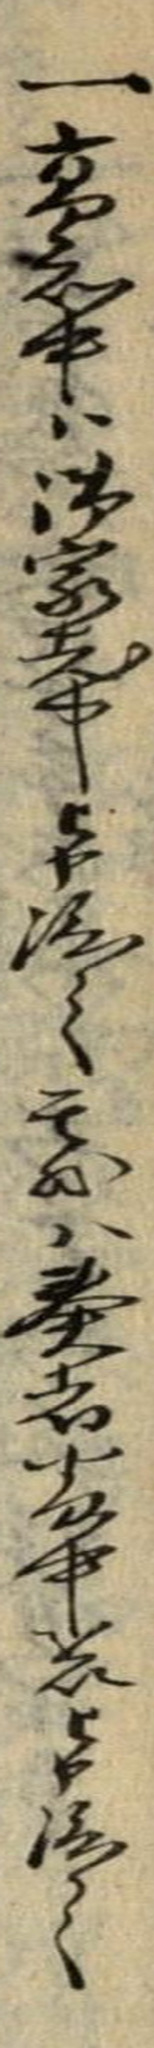一高知中は御家老中被申渡之其外は奏者番中を以被申渡
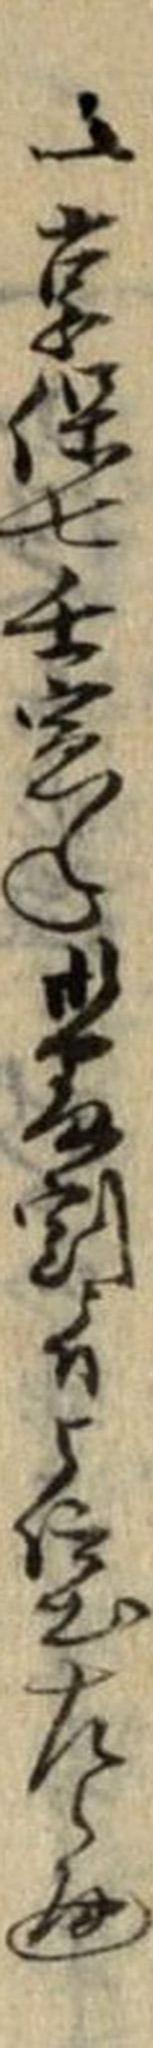一享保七壬寅年御番割に付被仰出左之通
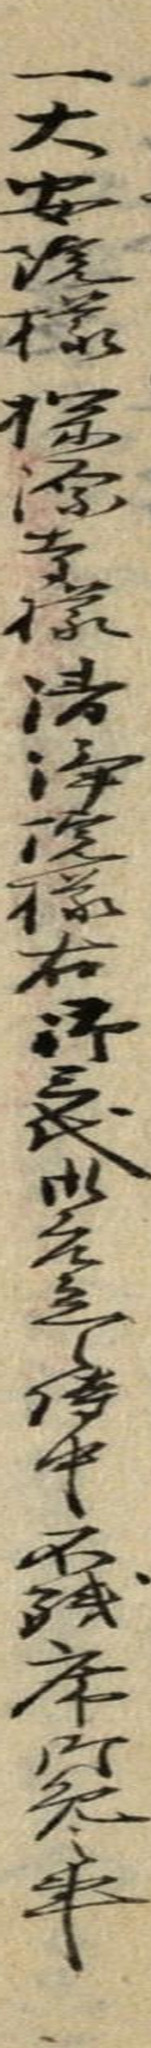一大安院様探源守様清浄院様右三代御取立之侍中不残席御免之事
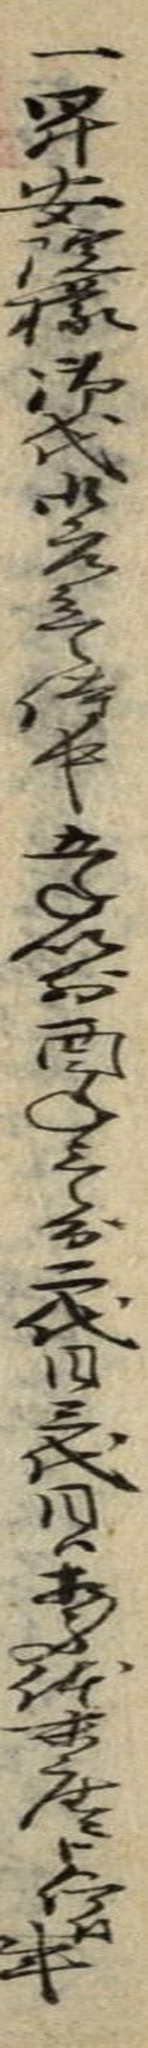一昇安院様御代御取立之侍中五年以前と酉年迄之分二代目三代目は相身体未座に被仰付候事
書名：御用并被仰出之部
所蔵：福井県文書館 Fukui Prefectural Archives
